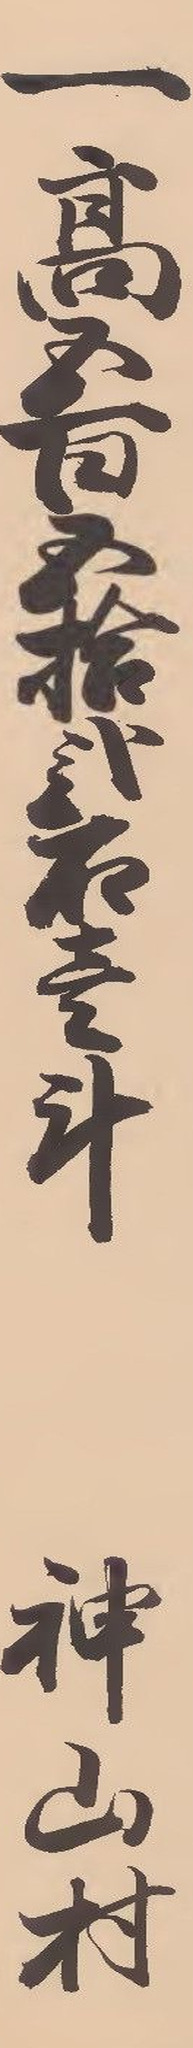一高五百五拾弐石壱斗神山村
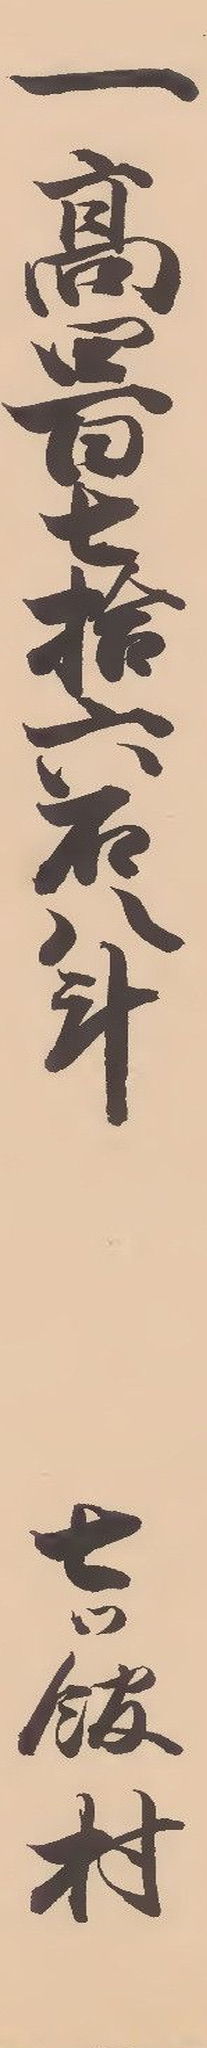一高四百七拾六石八斗七ツ館村
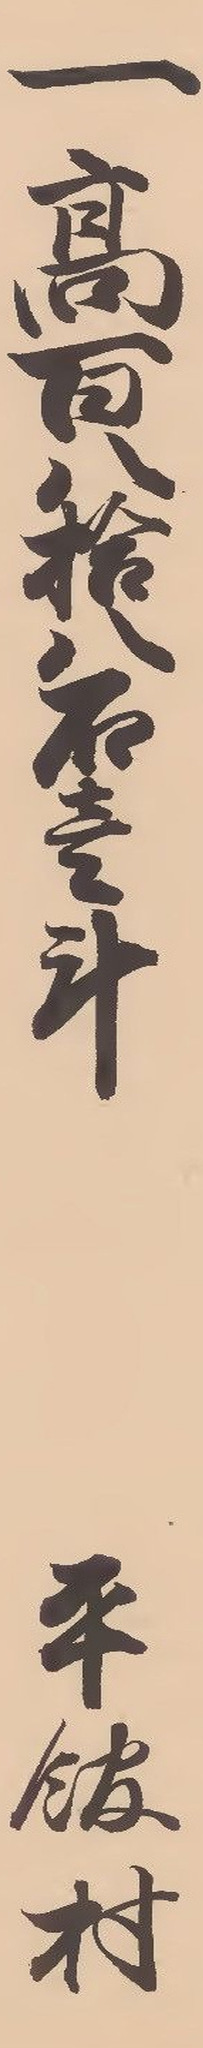一高百八拾八石壱斗平館村

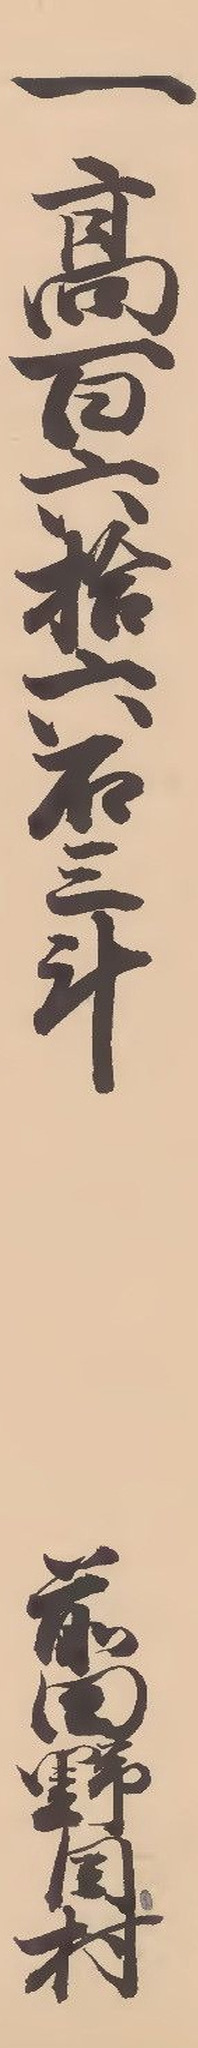一高百六拾六石三斗前田野目村
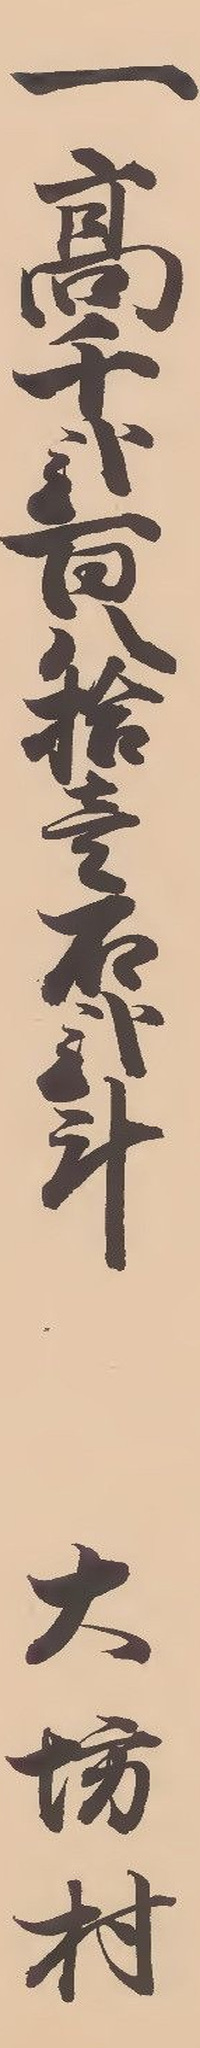一高千弐百八拾壱石弐斗大坊村
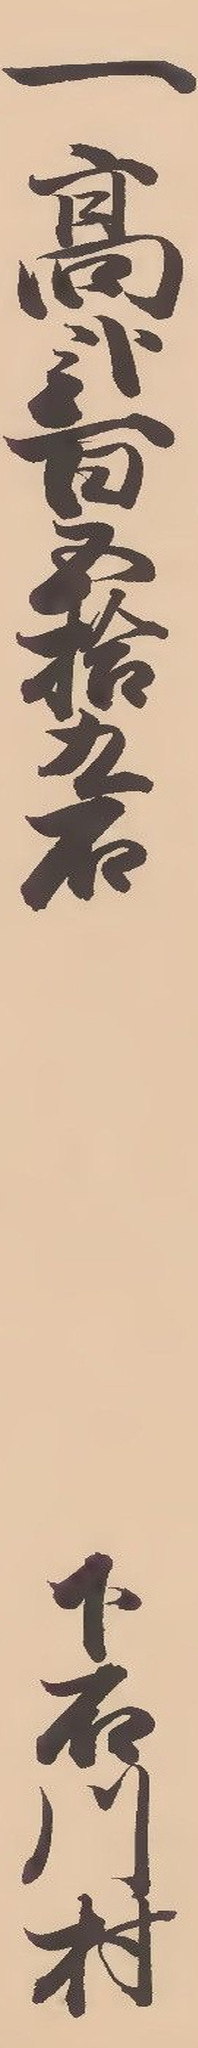一高弐百五拾九石下石川村
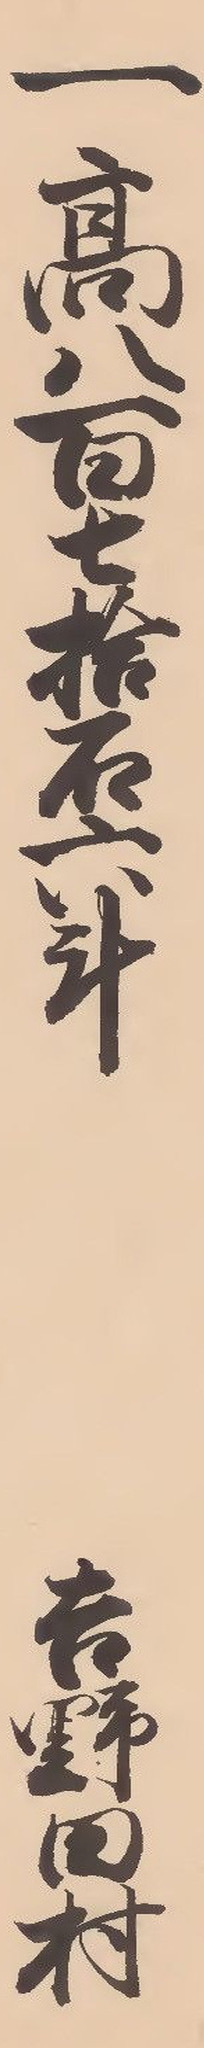一高八百七拾石六斗吉野田村
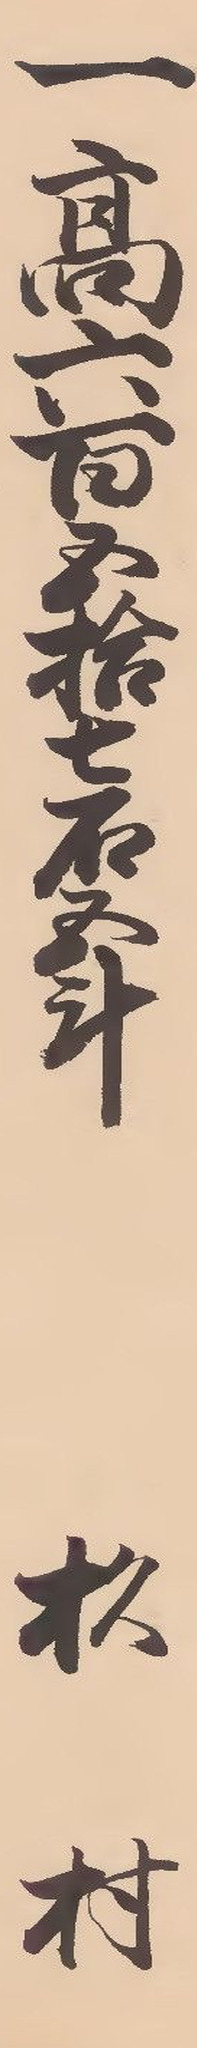一高六百五拾七石五斗杉村

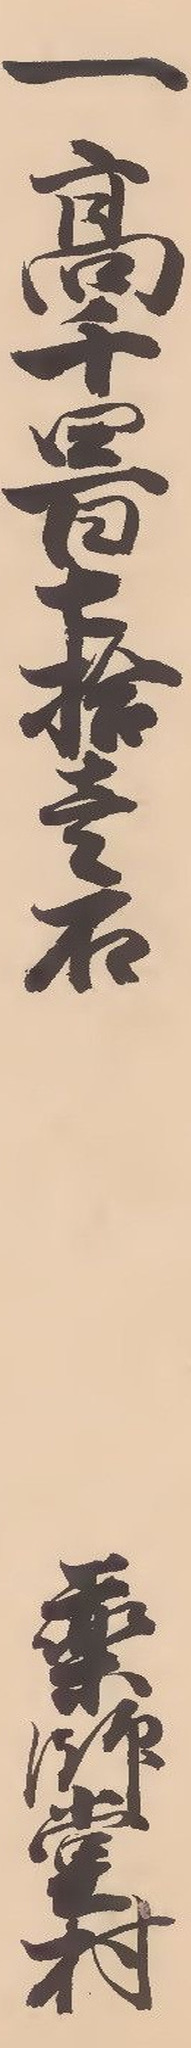一高千四百七拾壱石薬師堂村
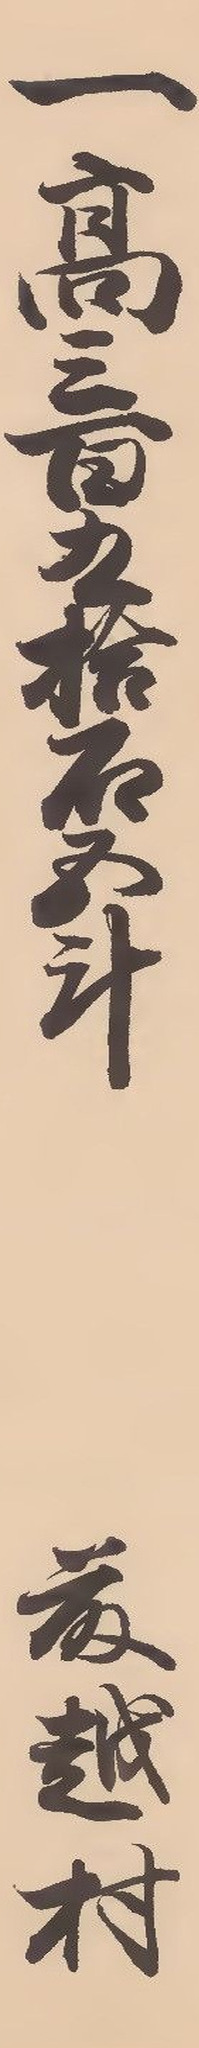一高三百九拾石五斗藤越村
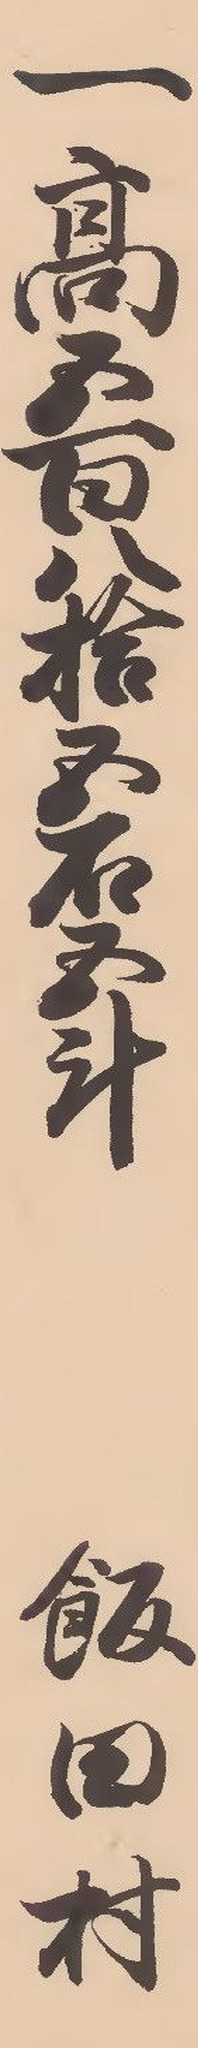一高五百八拾五石五斗飯田村
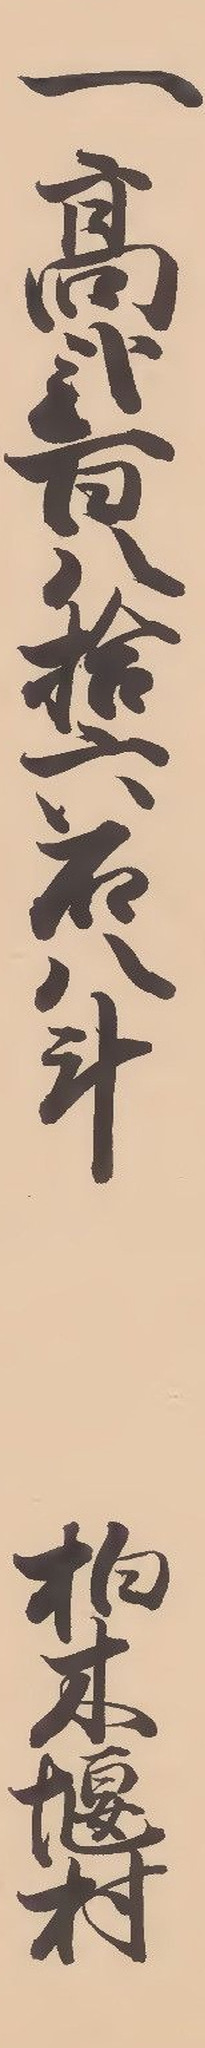一高弐百八拾六石八斗柏木堰村
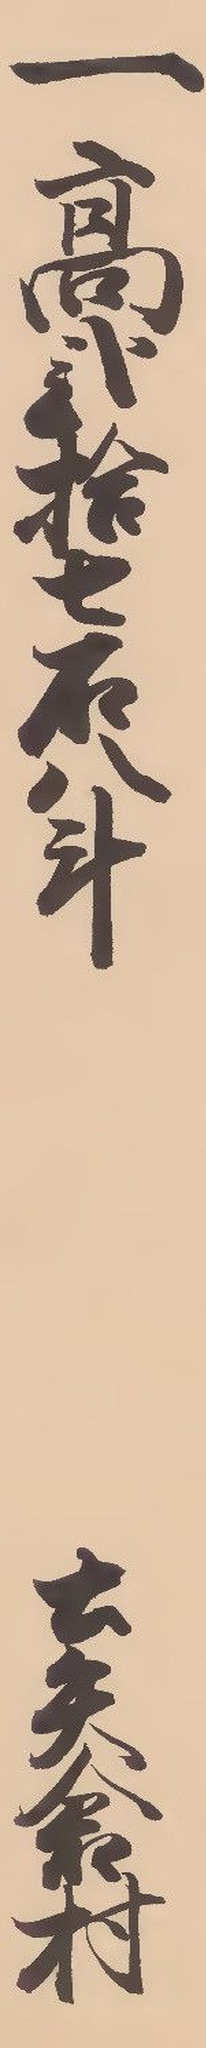一高弐拾七石八斗土矢倉村
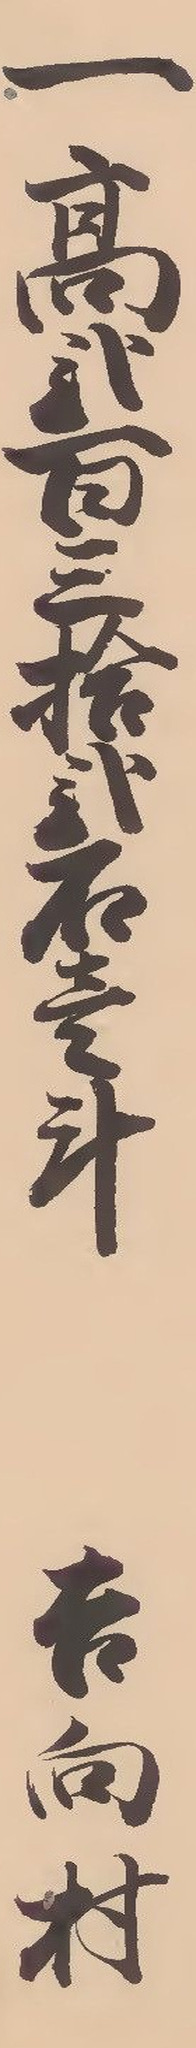一高弐百三拾弐石壱斗吉向村

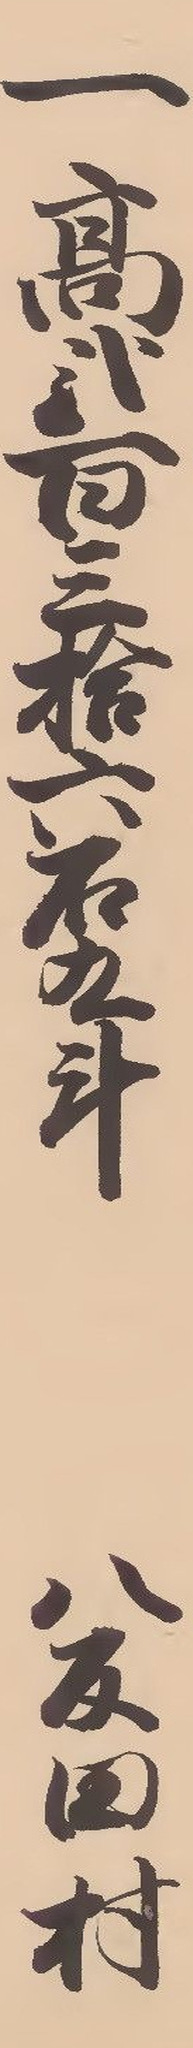一高弐百三拾六石九斗八反田村
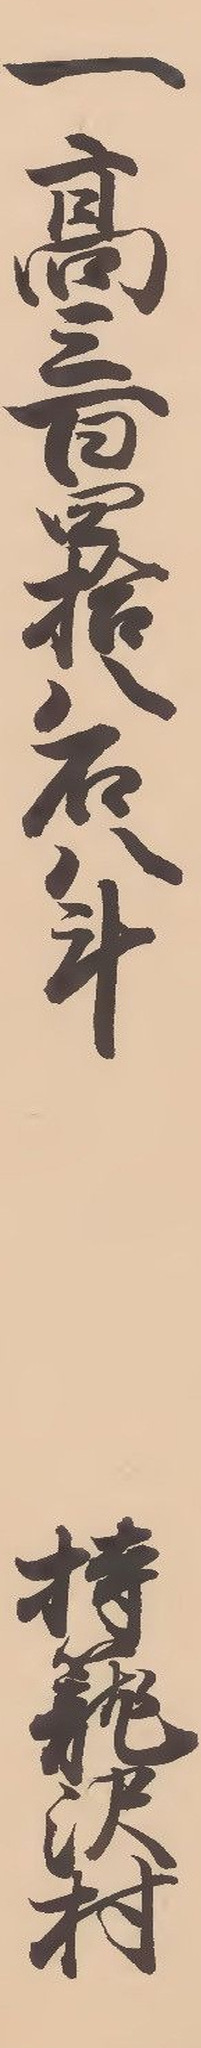一高三百四拾八石八斗持籠沢村
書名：陸奥国郷帳　７
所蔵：国立公文書館 National Archives of Japan
